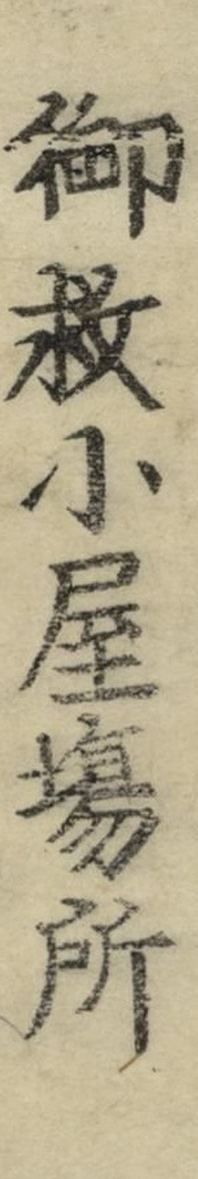御救小屋場所
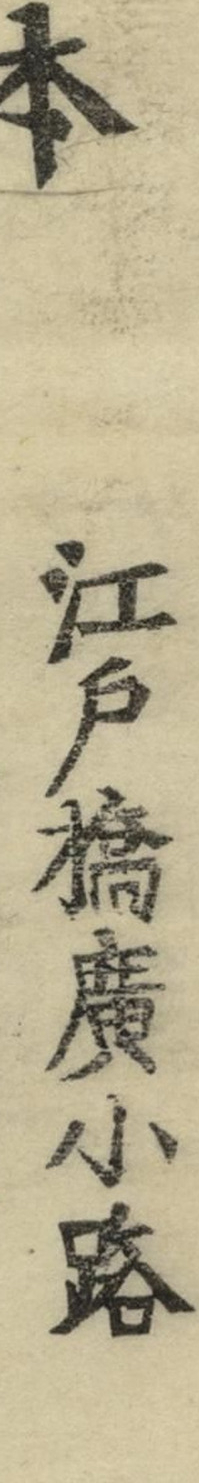江戸橋広小路同
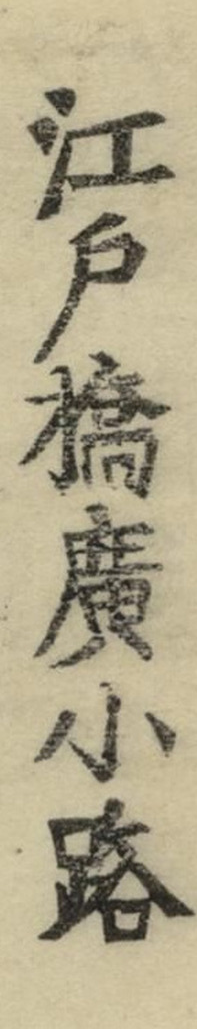江戸橋広小路同
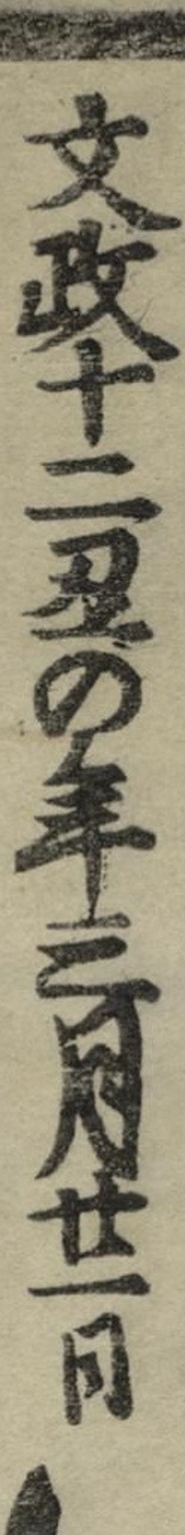文政十二丑の年三月廿一日
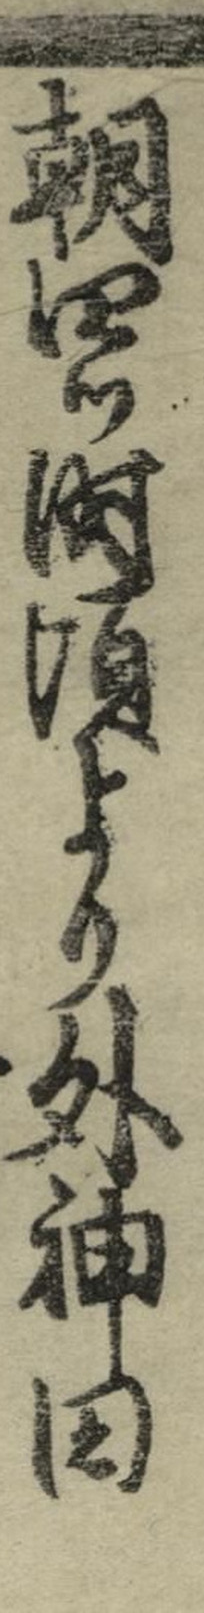朝四ッ時頃より外神田
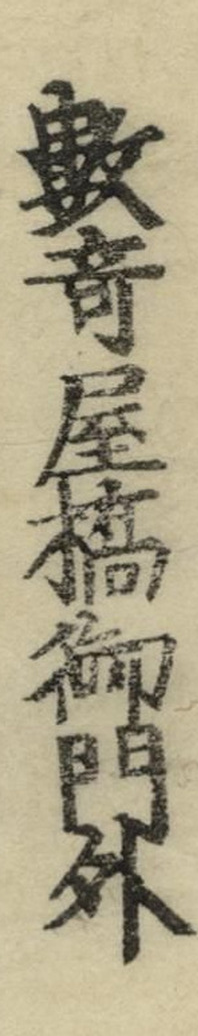数寄屋橋御門外同
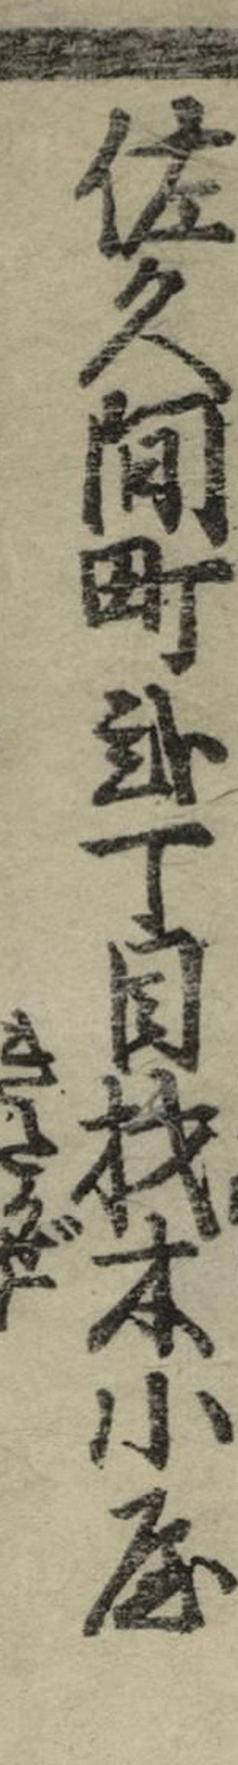佐久間町弐丁目材木小屋
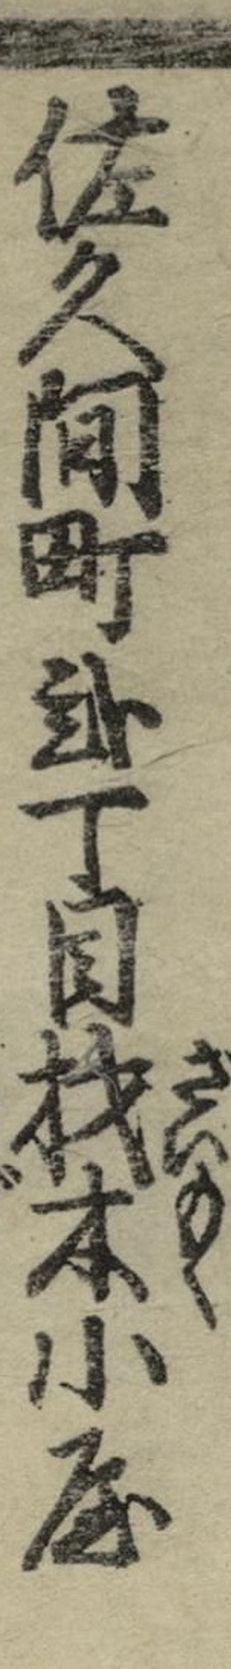佐久間町弐丁目材木小屋
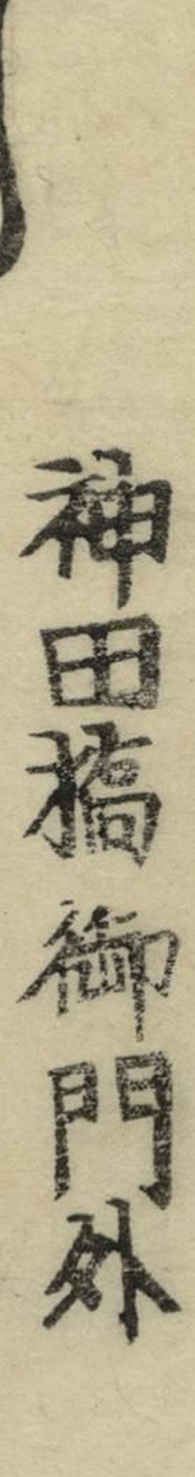神田橋御門外同
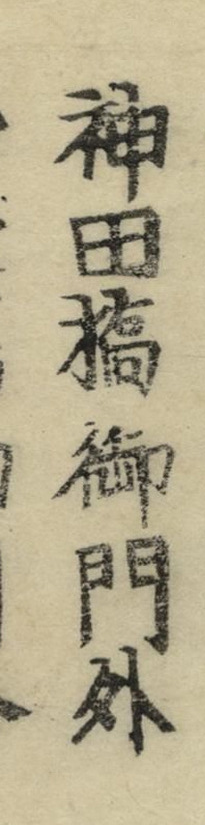神田橋御門外同
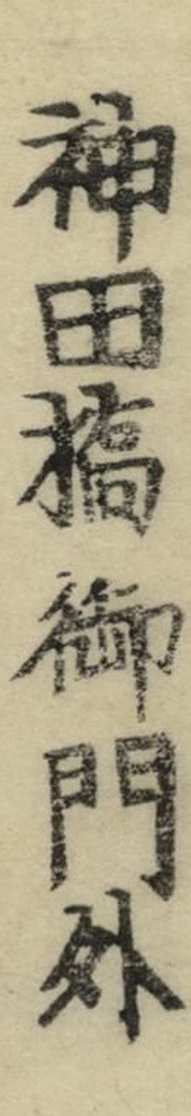神田橋御門外同
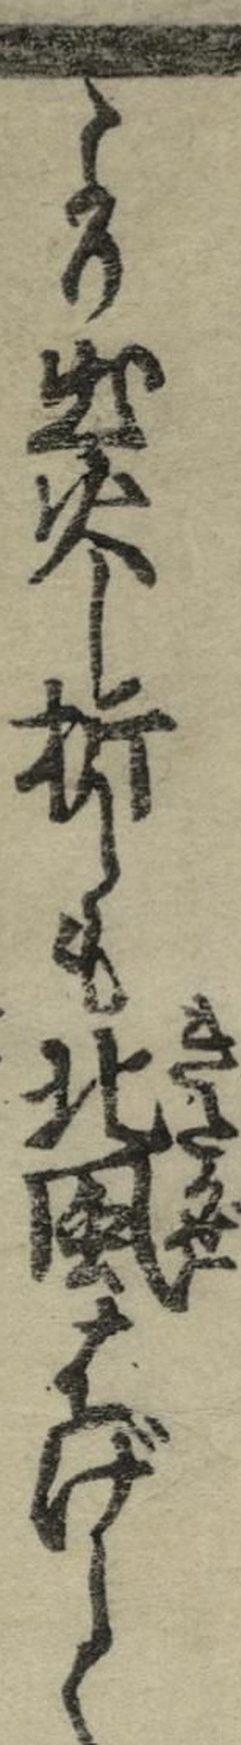より出火し折しも北風はげしく
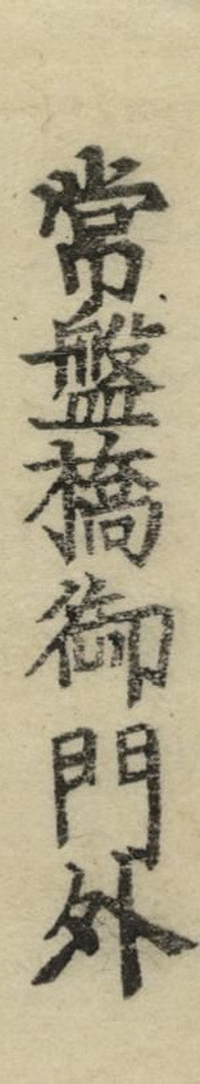常盤橋御門外同
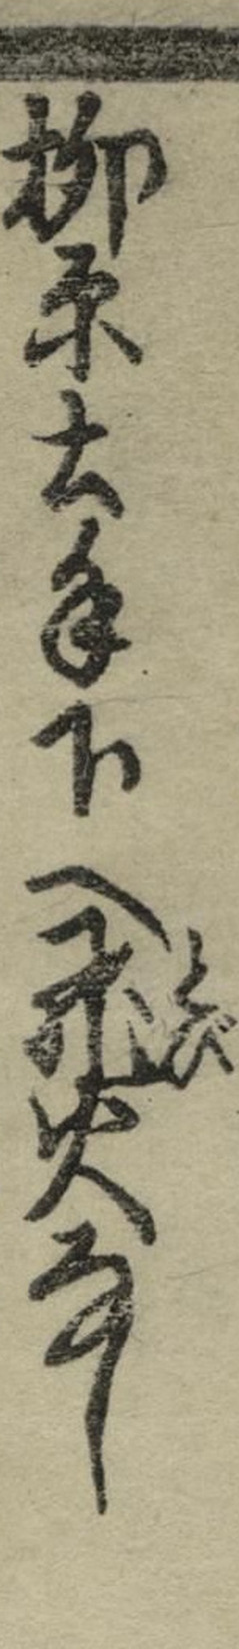柳原土手下へ飛火なし
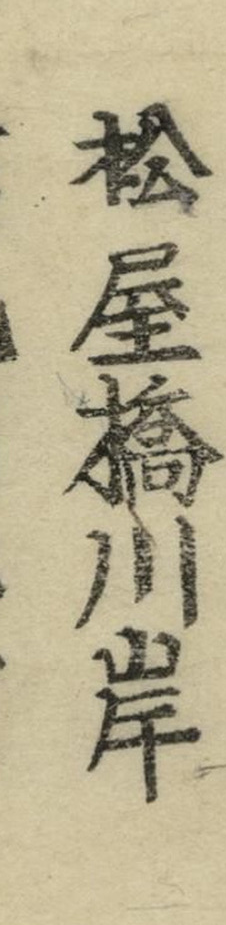松屋橋川岸同
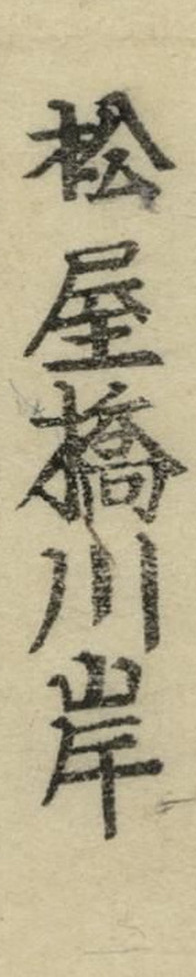松屋橋川岸同
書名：[文政十二年三月の江戸大火に関する瓦版]
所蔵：東京大学地震研究所図書室 Earthquake Research Institute Library, The University of Tokyo, JAPAN
